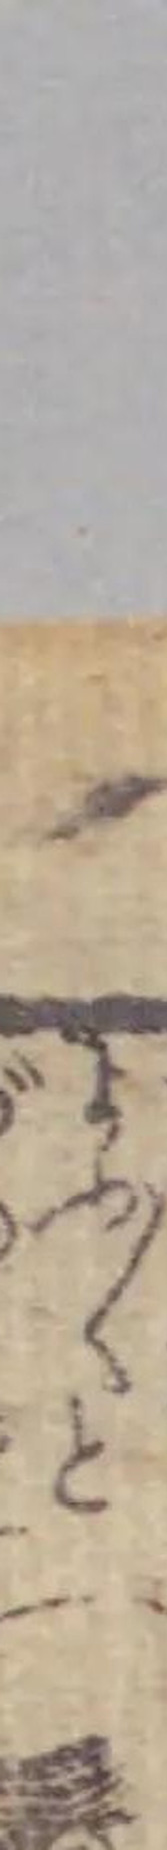よふ〳〵と
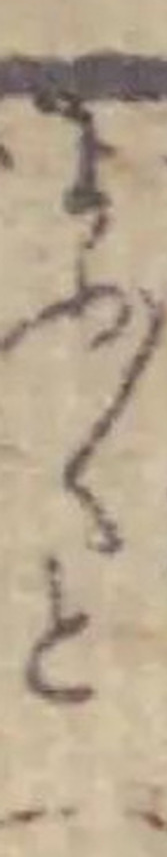よふ〳〵と
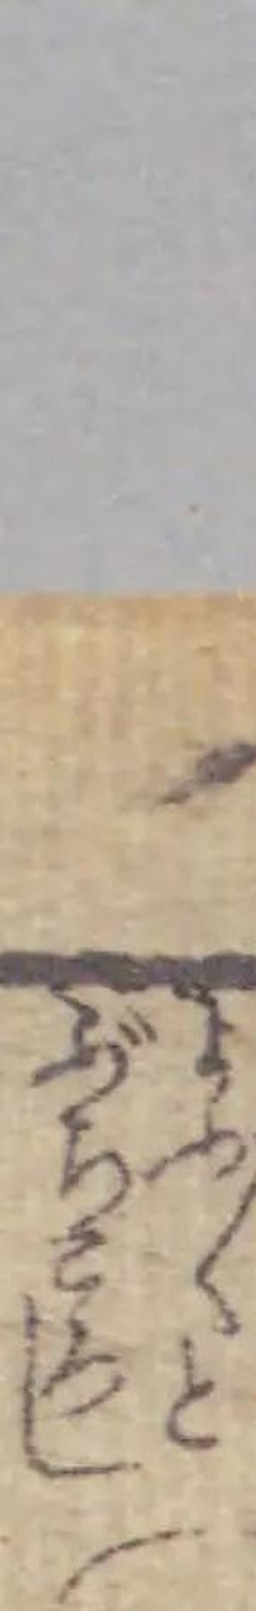ぶちころし
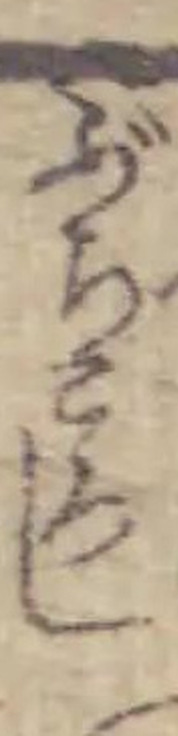ぶちころし
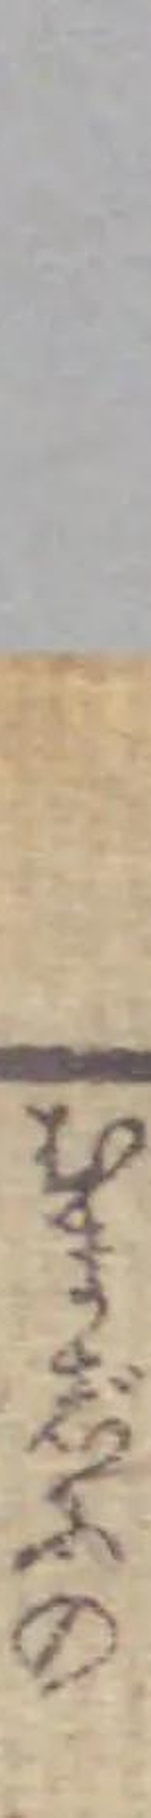むまじにの
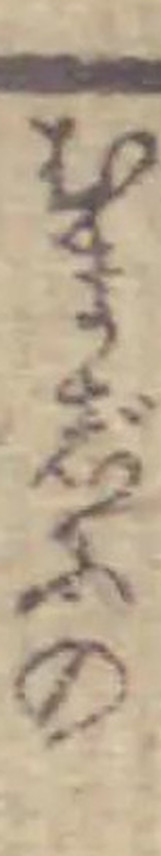むまじにの
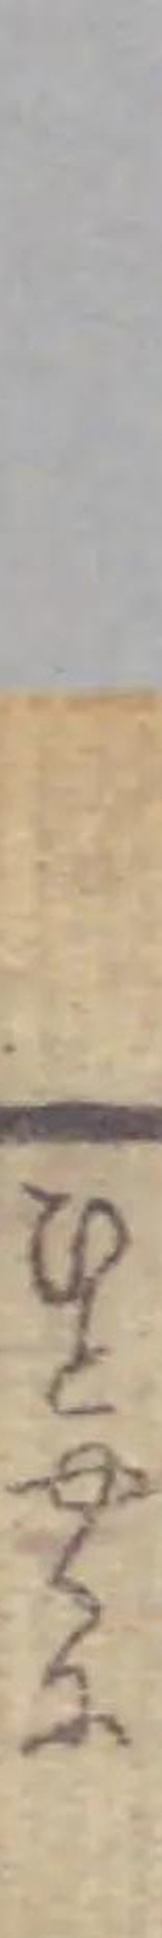ひとやくに
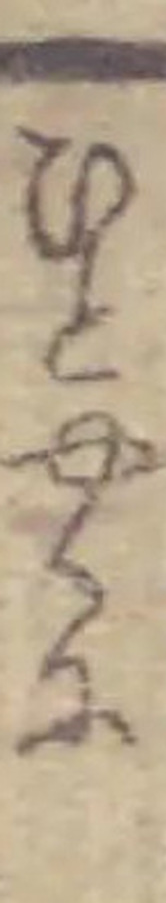ひとやくに
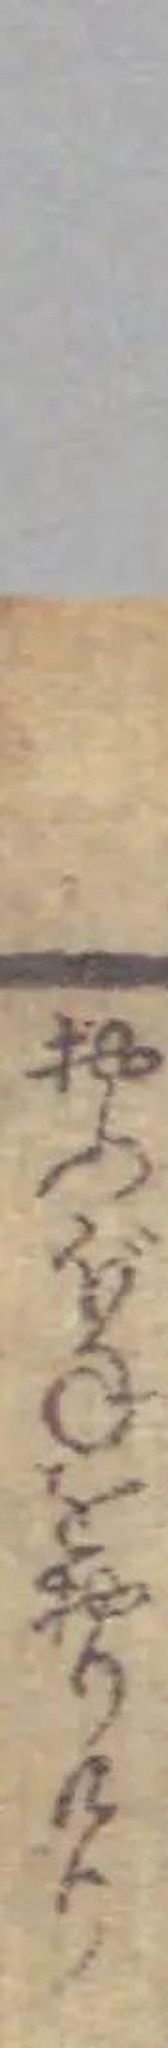おふぼねをおりけり
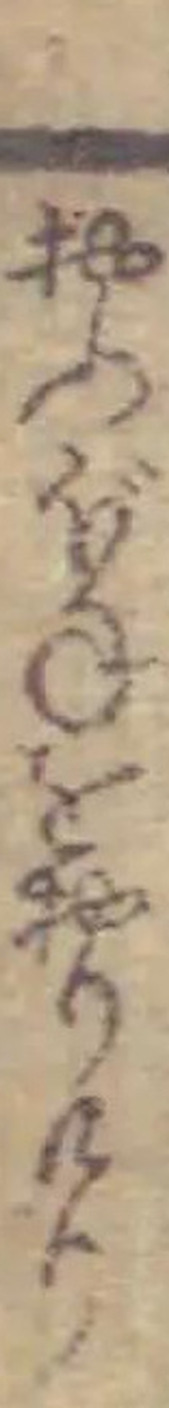おふぼねをおりけり

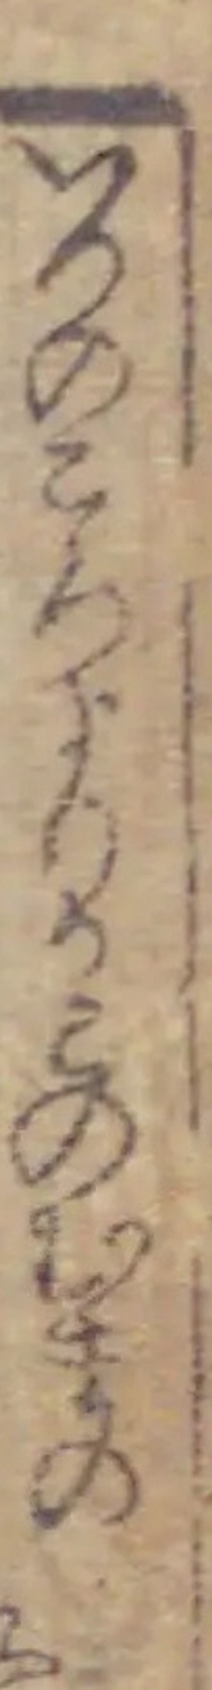いつのころよりかこのむまの
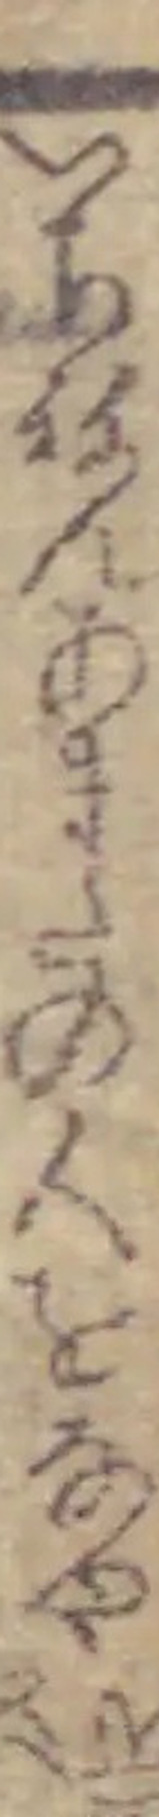いちねんあまたの人をなや
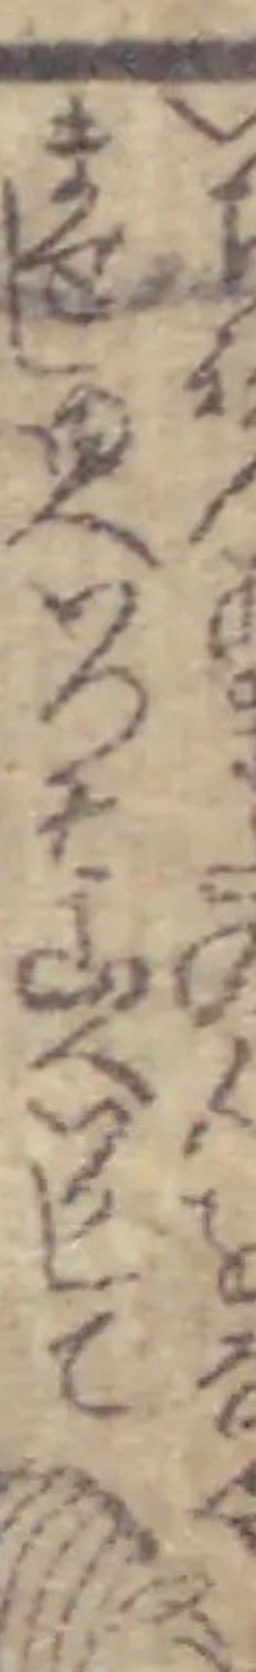ませしゆへいつそ山へいかして
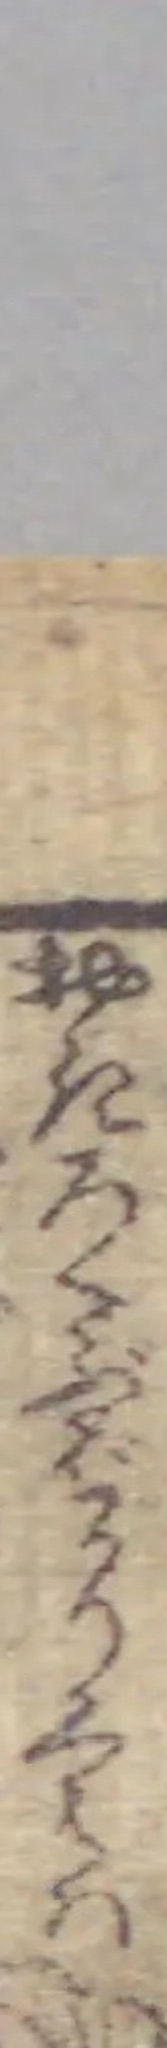おきろくぶばかりくらは
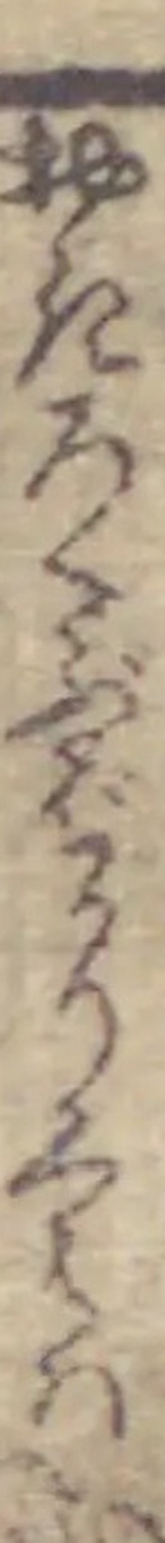おきろくぶばかりくらは
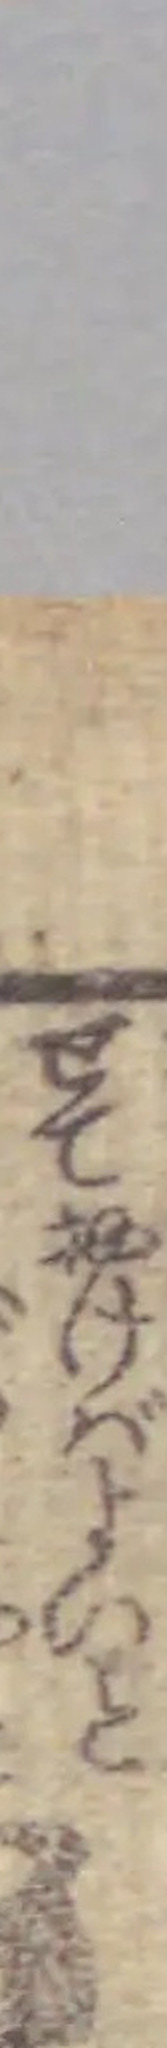せておけばよいと
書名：もふもふもふ怖噺 2巻
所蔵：国立国会図書館 National Diet Library, JAPAN
